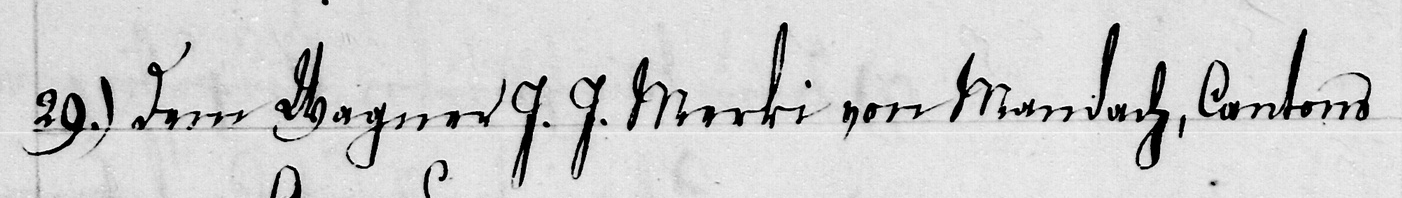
29.) Dem Wagner J. J. Merki von Mandach, Cantons
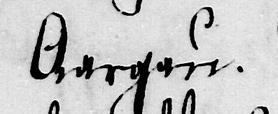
Aargau.
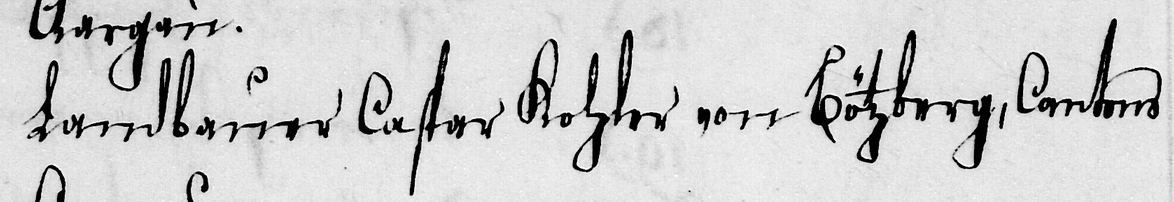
Landbauer Caspar Kohler von Bötzberg, Cantons
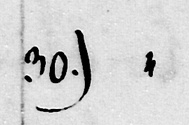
30.) “
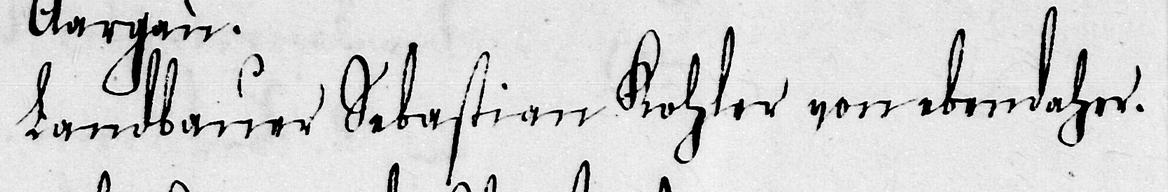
Landbauer Sebastian Kohler von ebendaher.
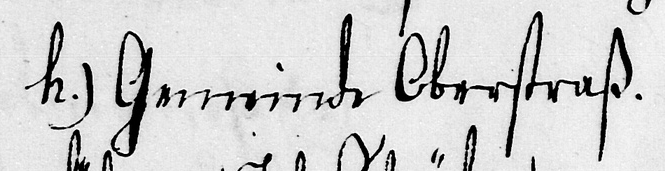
h.) Gemeinde Oberstraß.
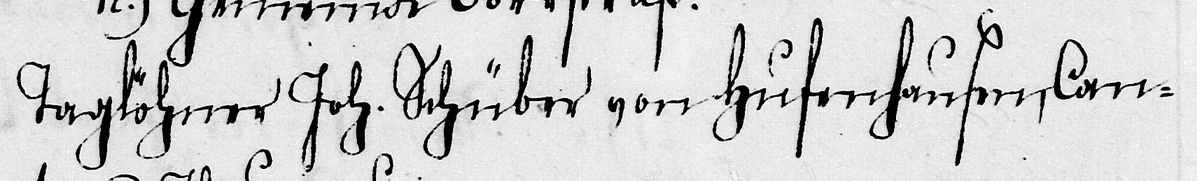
Taglöhner Joh. Schüber von Hufenhausen, Can¬
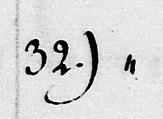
32.) “
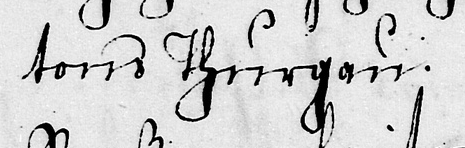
tons Thurgau.
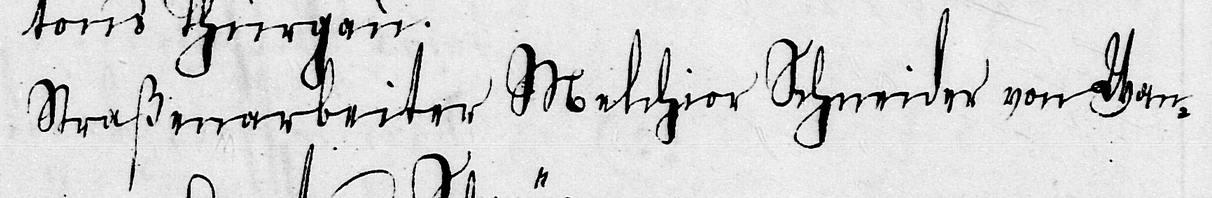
Straßenarbeiter Melchior Schneider von Wan¬
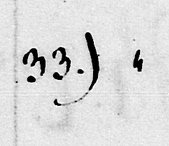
33.) “
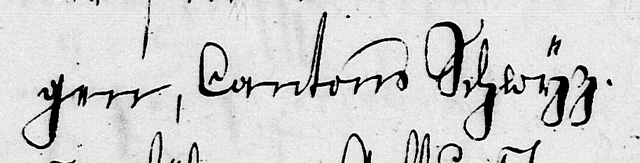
gen, Cantons Schwyz.
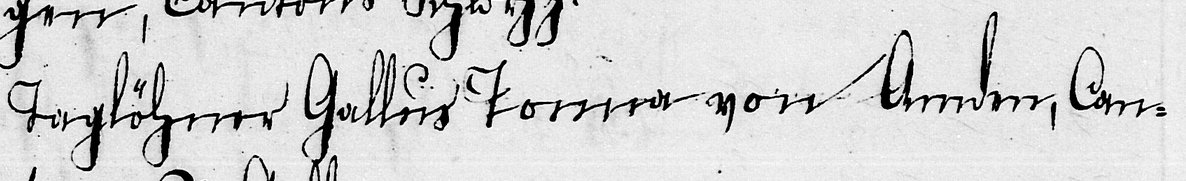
Taglöhner Gallus Tonna von Amden, Can¬
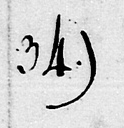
34.)
